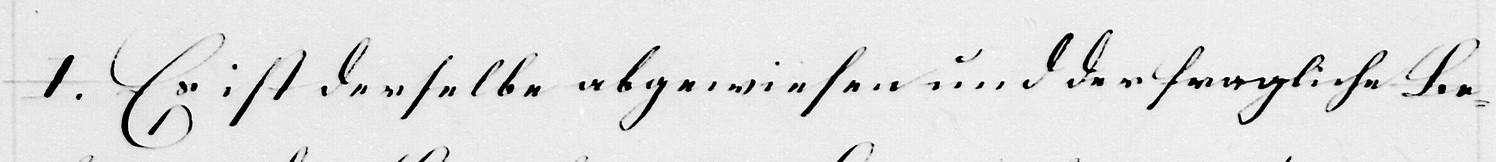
I. Es ist derselbe abgewiesen und der fragliche Be¬
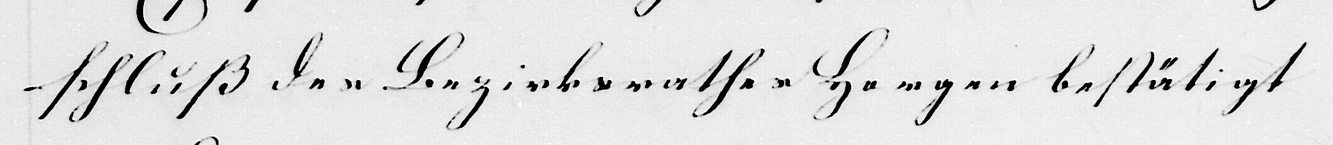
schluß des Bezirksrathes Horgen bestätigt
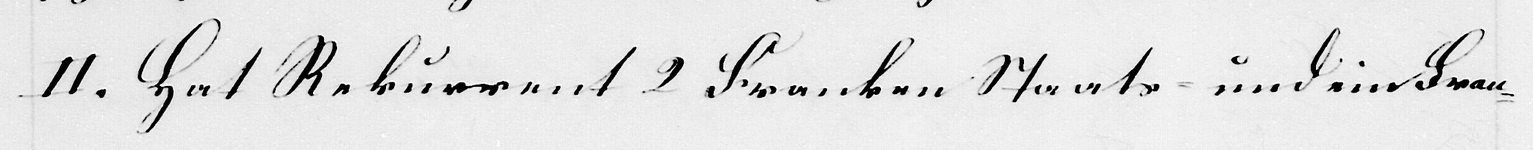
II. Hat Rekurrent 2 Franken Staats- und ein Fran¬
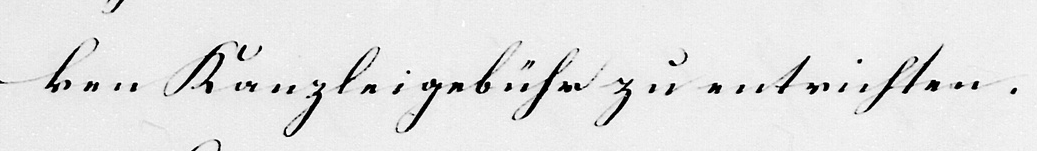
ken Kanzleigebühr zu entrichten.
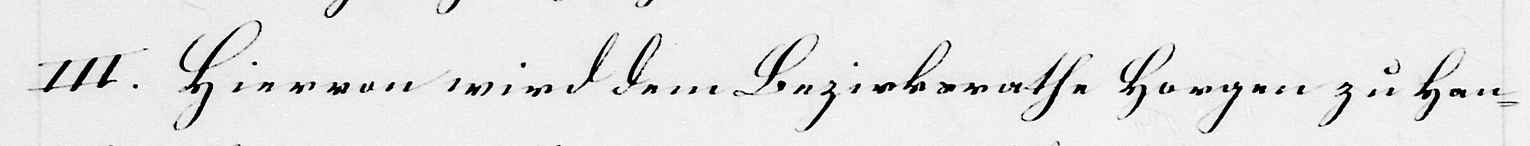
III. Hiervon wird dem Bezirksrathe Horgen zu Han¬
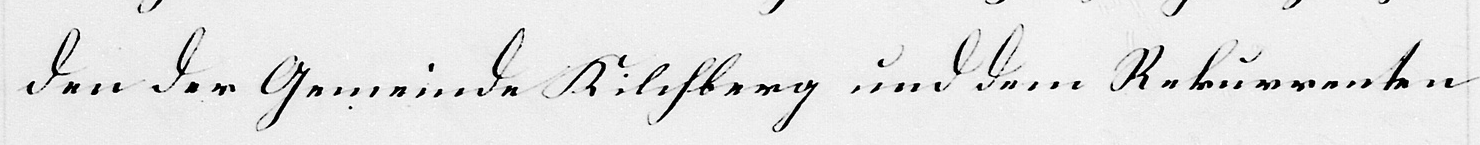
den der Gemeinde Kilchberg und dem Rekurrenten
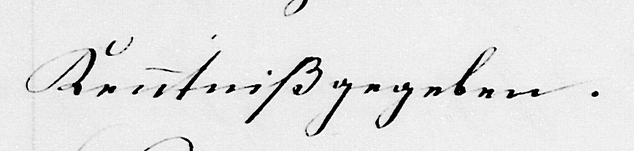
Kenntniß gegeben.
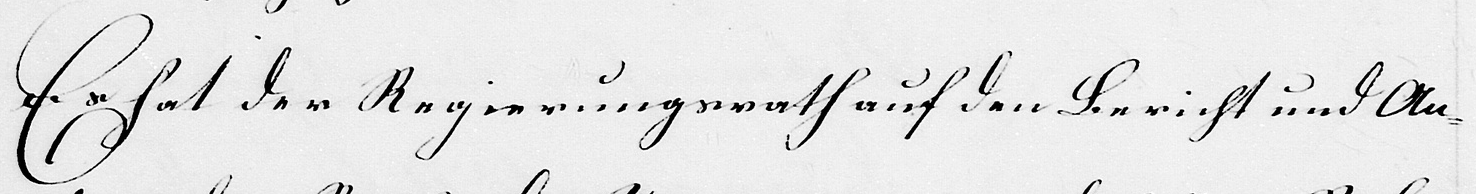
Es hat der Regierungsrath auf den Bericht und An¬
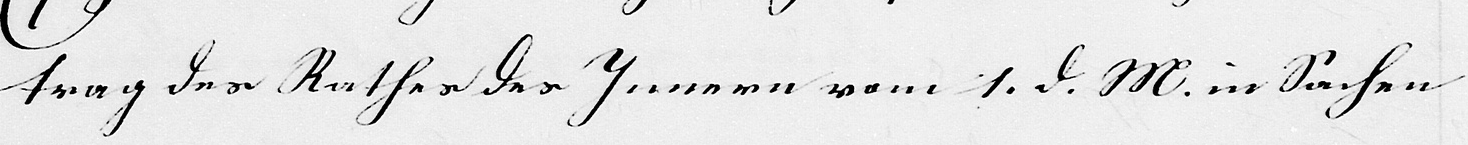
trag des Rathes des Innern vom 1. d. M. in Sachen
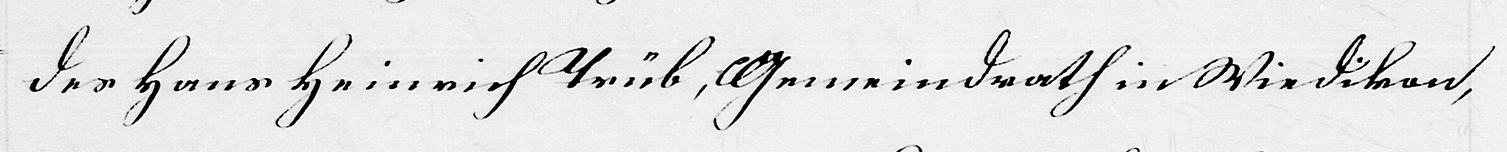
des Hans Heinrich Trüb, Gemeindrath in Wiedikon,
